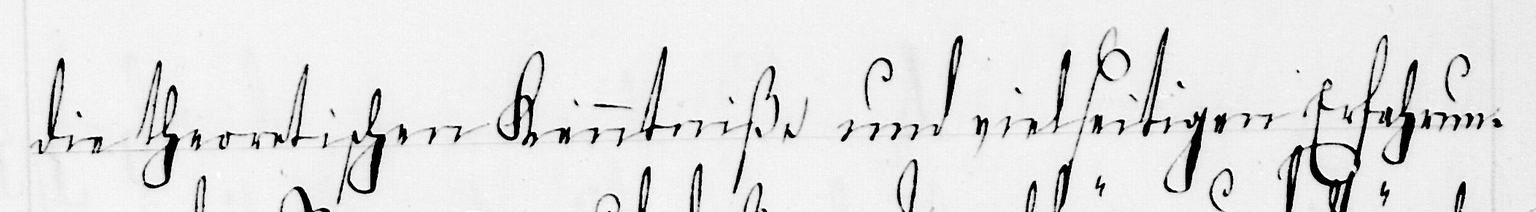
die theoretischen Kenntniße und vielseitigen Erfahrun¬
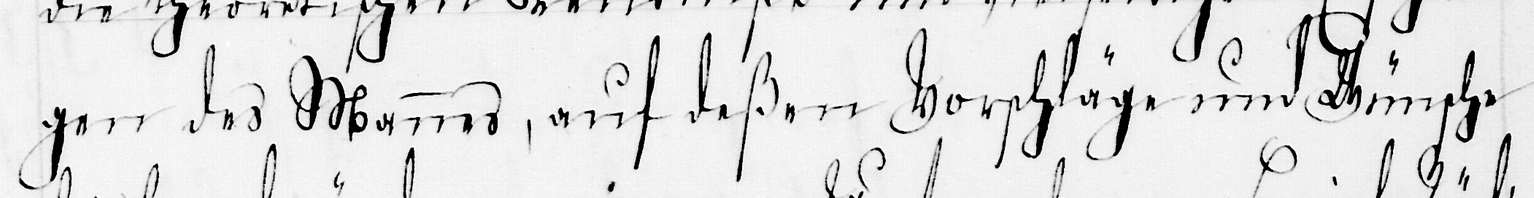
gen des Mannes, auf deßen Vorschläge und Wünsche
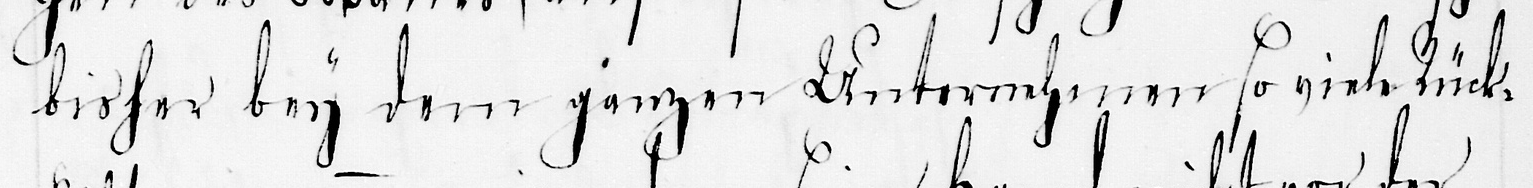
bisher bey dem ganzen Unternehmen so viele Rück¬
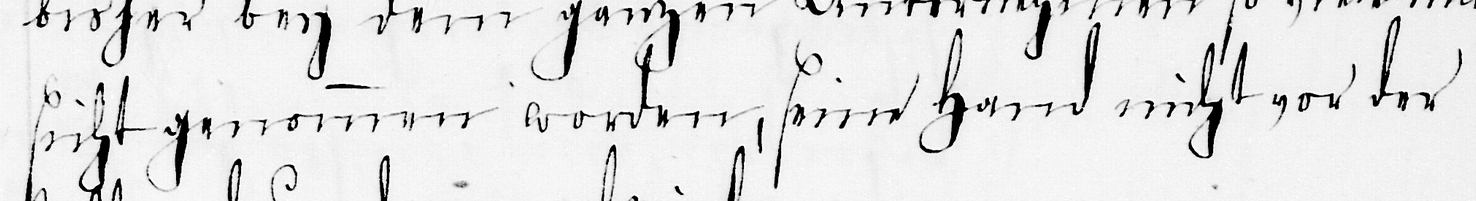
sicht genommen worden, seine Hand nicht vor der
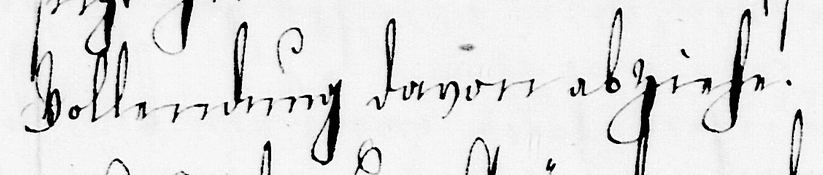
Vollendung davon abziehe.
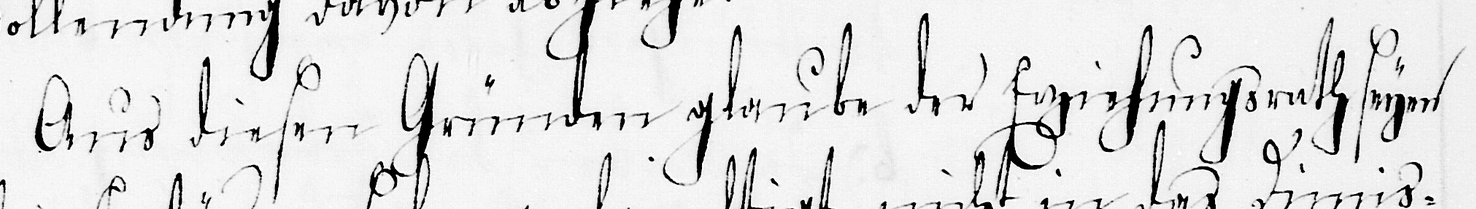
Aus diesen Gründen glaube der Erziehungsrath seyen
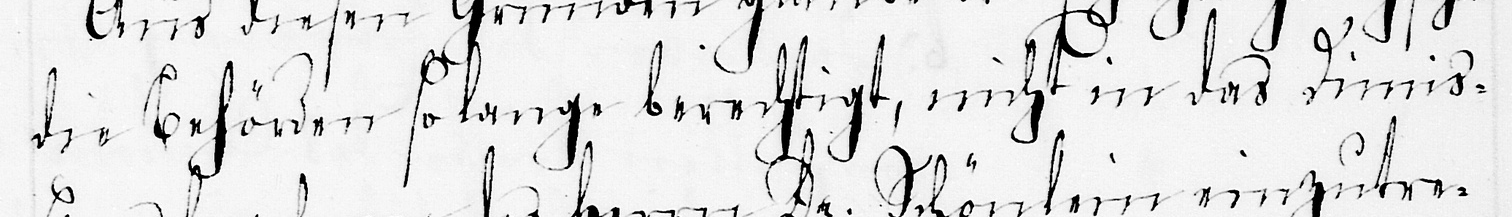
die Behörden so lange berechtigt, nicht in das Dimis¬
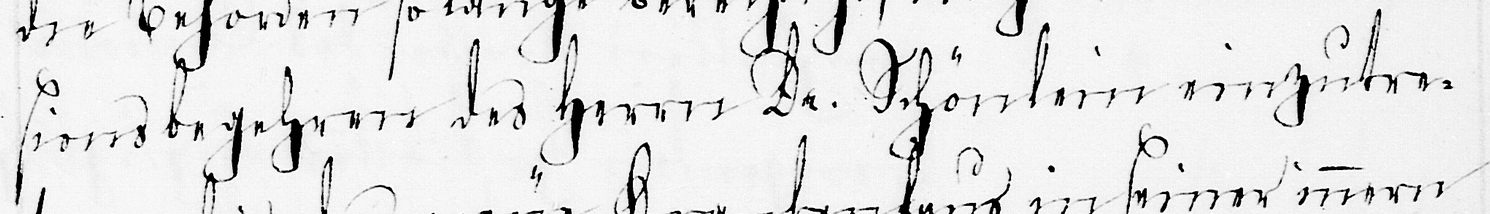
sionsbegehren des Herrn Dr. Schönlein einzutre¬
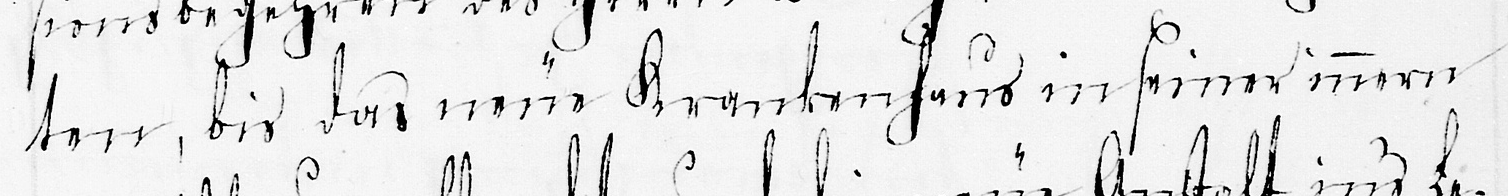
ten, bis das neue Krankenhaus in seiner innern
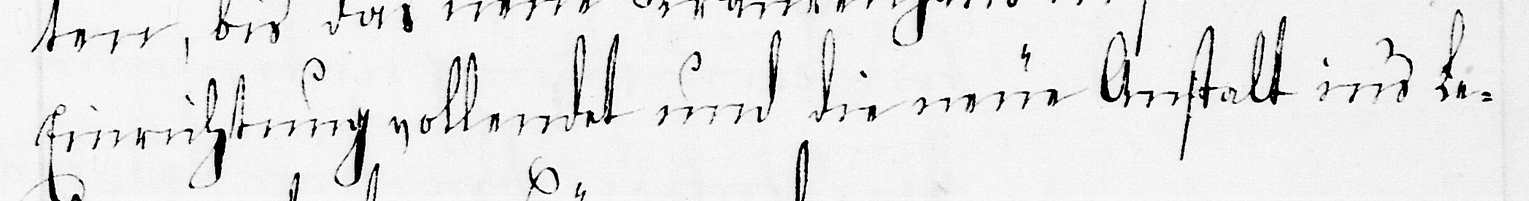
Einrichtung vollendet und die neue Anstalt in‘s Le¬
